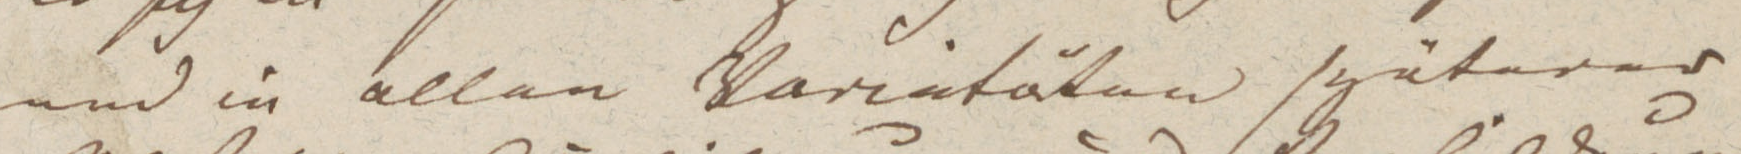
und in allen Varietäten späterer
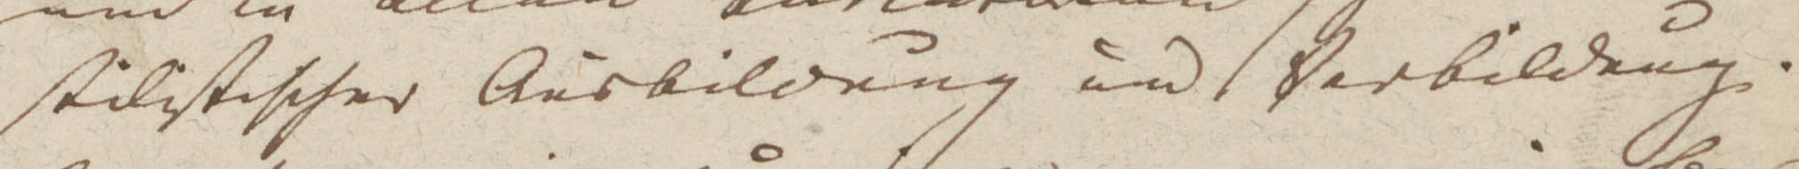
stilistischer Ausbildung und Verbildung.
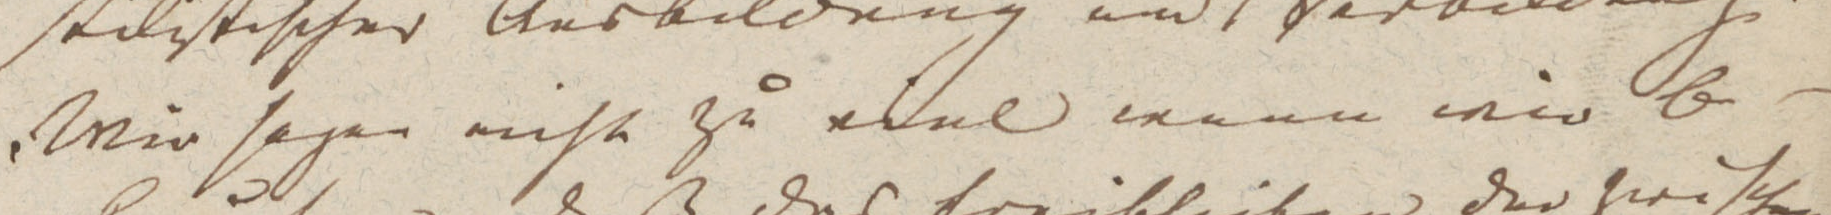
Wir sagen nicht zu viel wenn wir be-
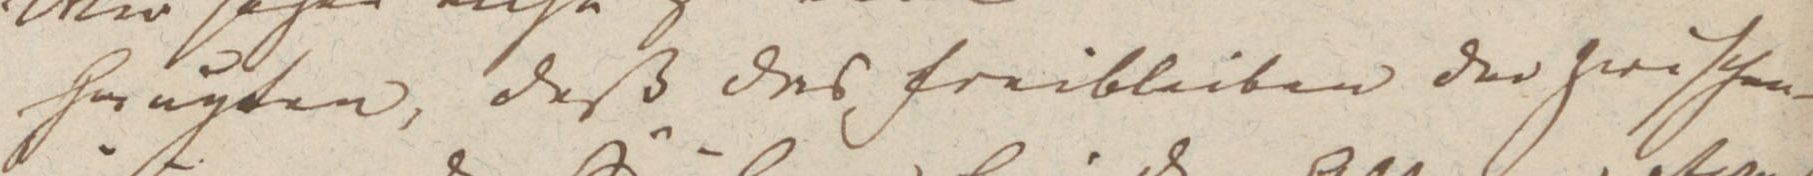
haupten, dass das Freibleiben der Zwischen-
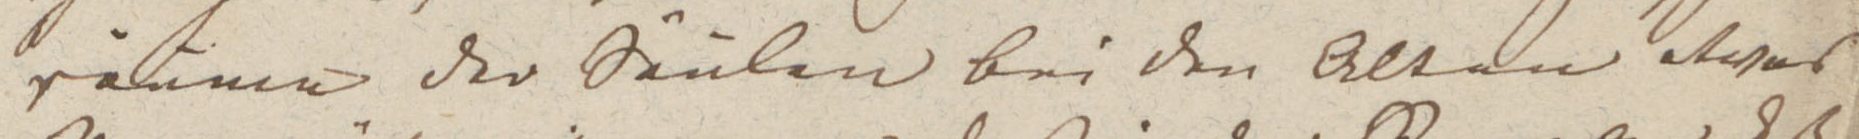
räume der Säulen bei den Alten etwas
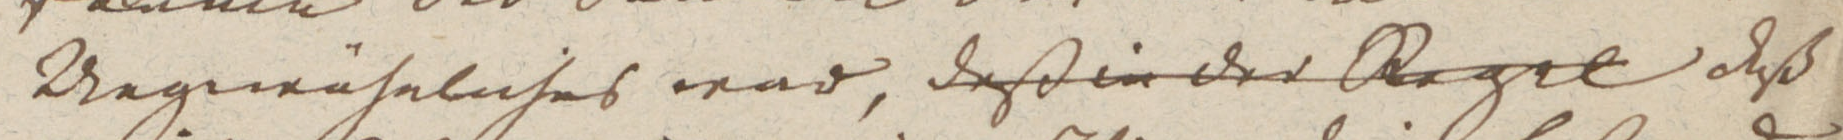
Ungewöhnliches war, dass in der Regel dass
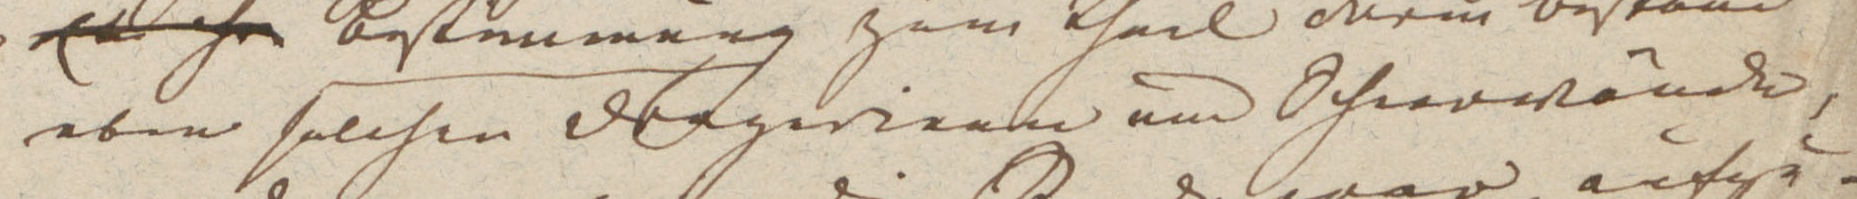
eben solchen Draperieen und Scheerwände,
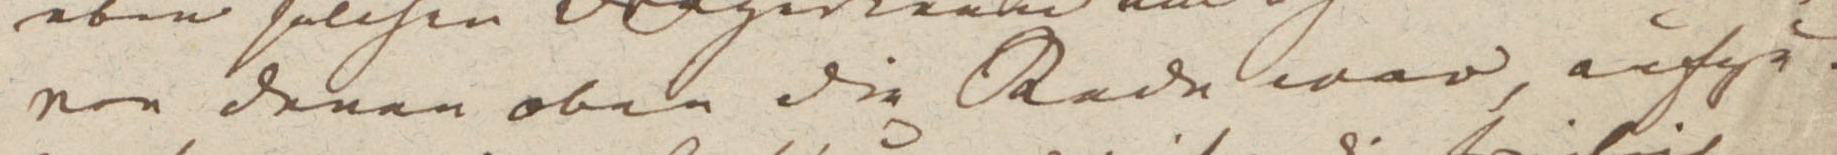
von denen oben die Rede war, aufzu-
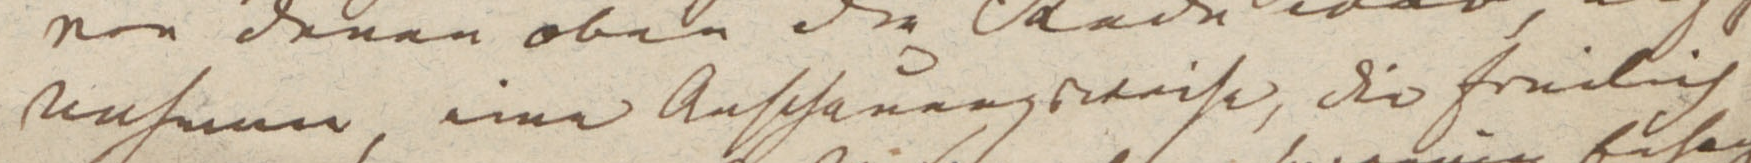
nehmen, eine Anschauungsweise, die freilich
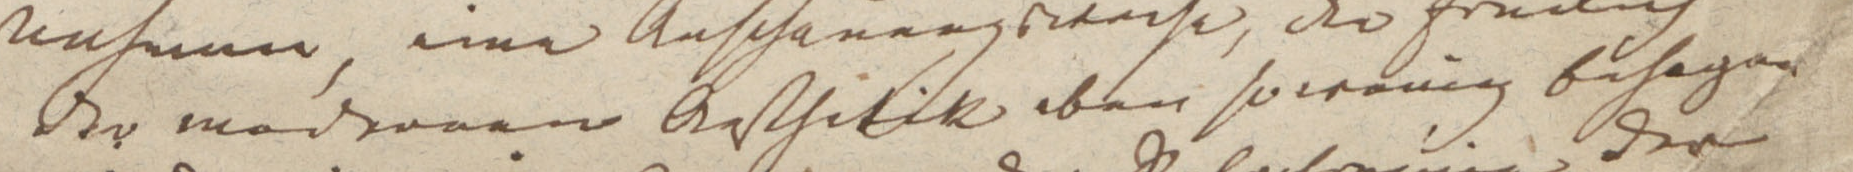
der modernen Aesthetik eben so wenig behagen
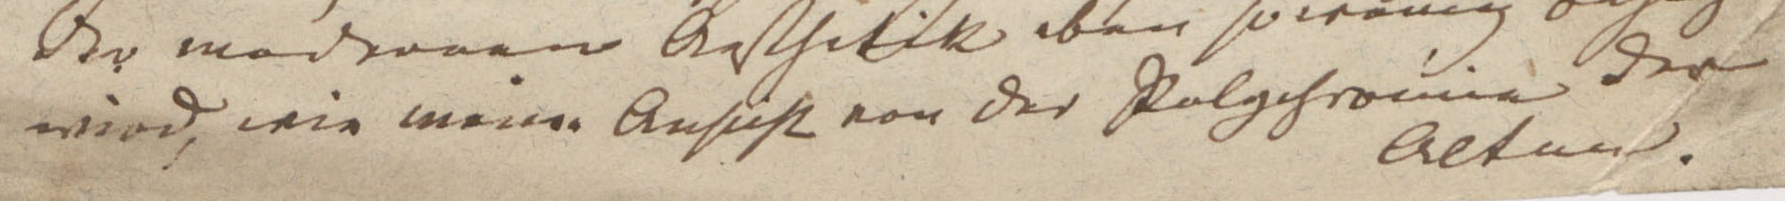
wird, wie meine Ansicht von der Polychromie der
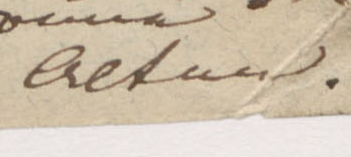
Alten.
